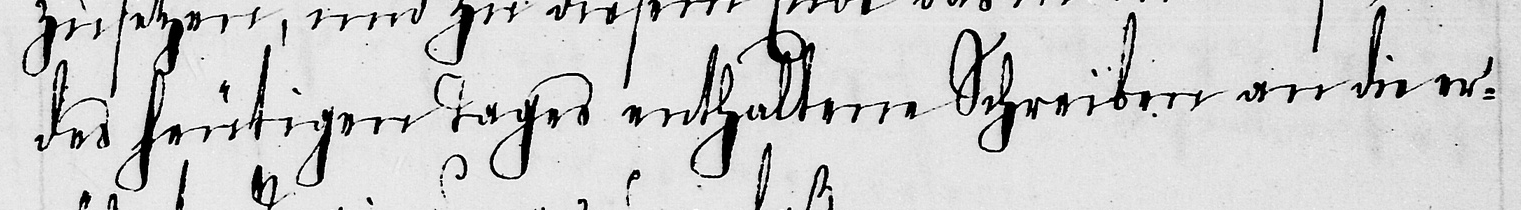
des heutigen Tages enthaltene Schreiben an die er¬
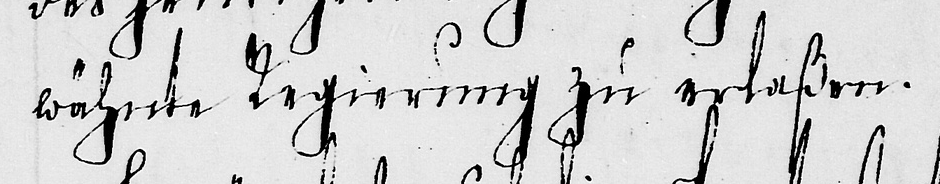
wähnte Regierung zu erlaßen.
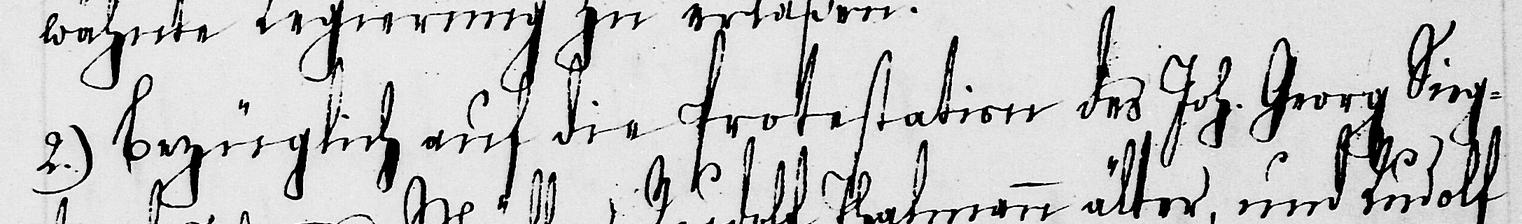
2.) Bezüglich auf die Protestation des Joh. Georg Sieg¬
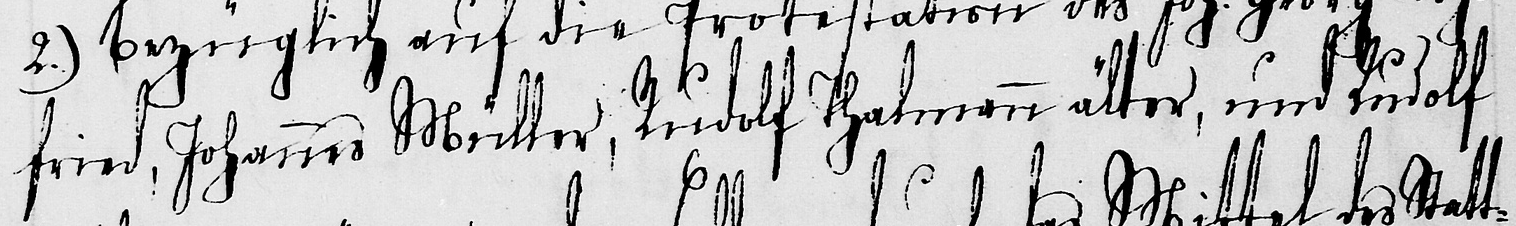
fried, Johannes Müller, Rudolf Thalmann älter, und Rudolf
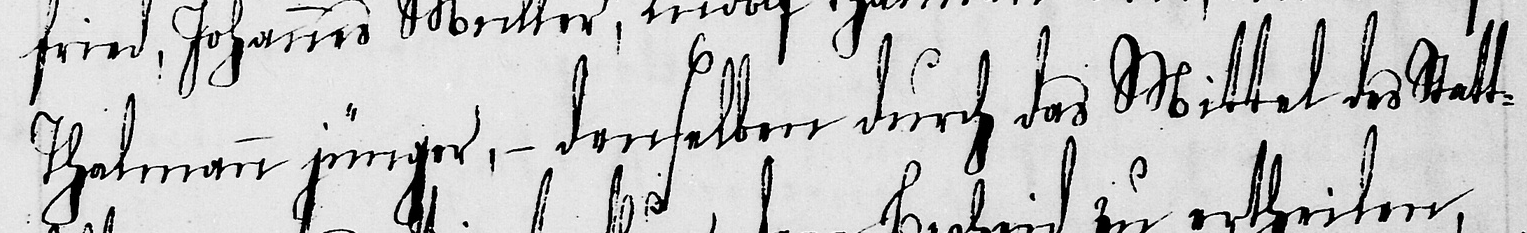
Thalmann jünger, – denselben durch das Mittel des Stat¬
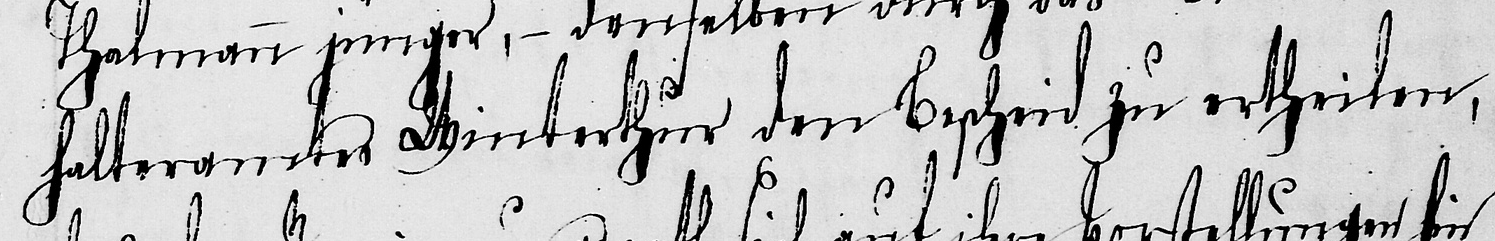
thalteramtes Winterthur den Bescheid zu erhteilen,
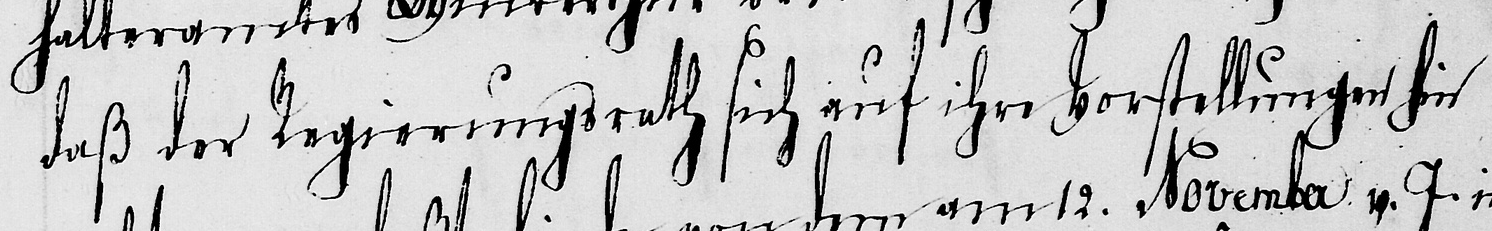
daß der Regierungsrath sich auf ihre Vorstellungen hin
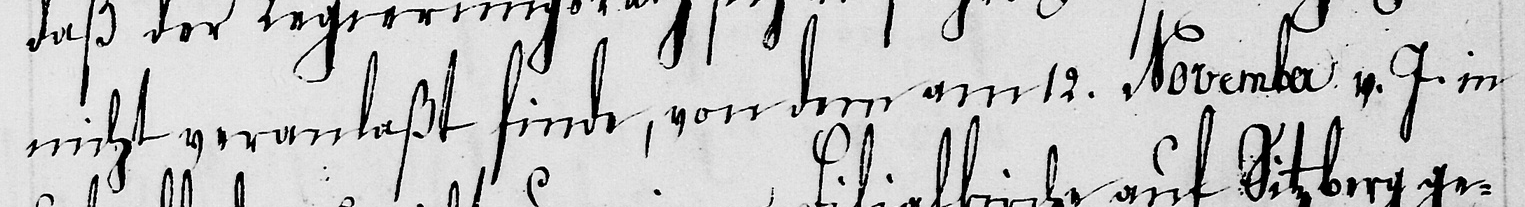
nicht veranlaßt finde, von dem am 12. November v. J. in
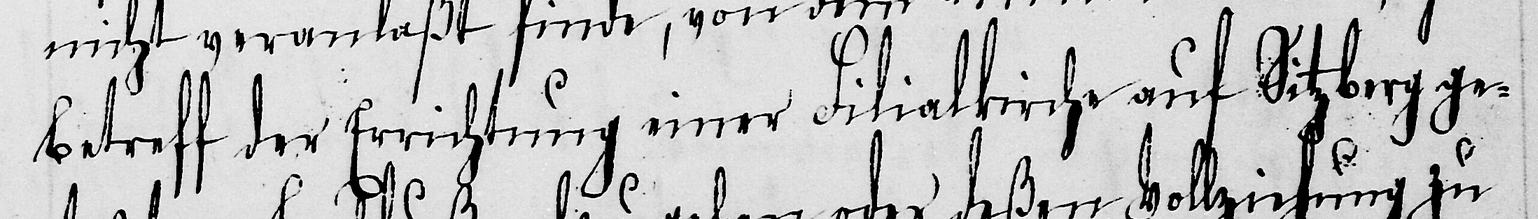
Betreff der Errichtung einer Filialkirche auf Sitzberg ge¬
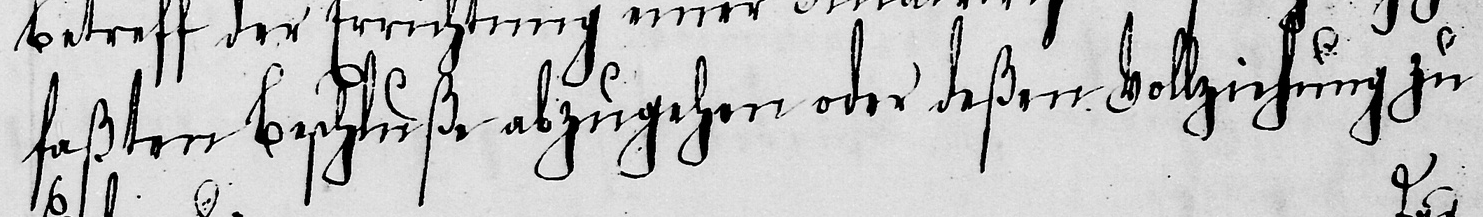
faßten Beschluße abzugehen oder deßen Vollziehung zu
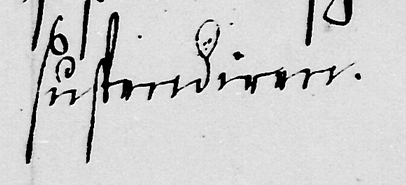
suspendiren.
